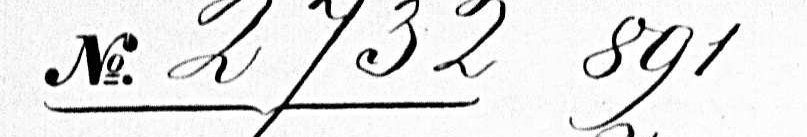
No. 2732 1891
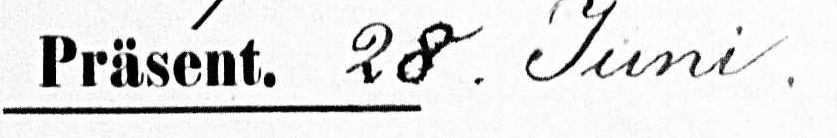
Präsent. 28 Juni
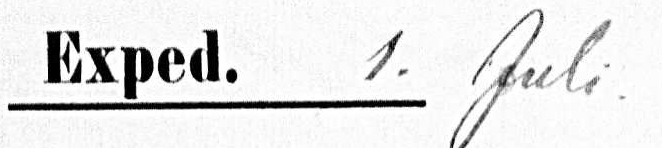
Exped. 1. Juli
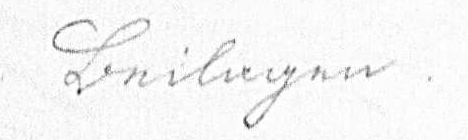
Beilagen
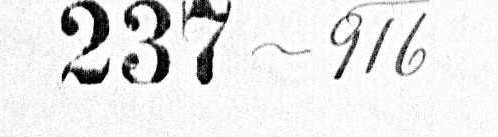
237 – 1916
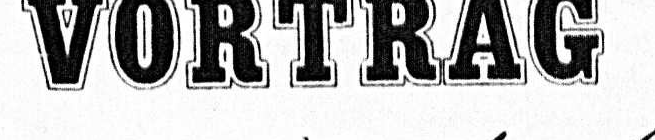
VORTRAG
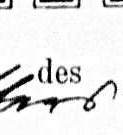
des
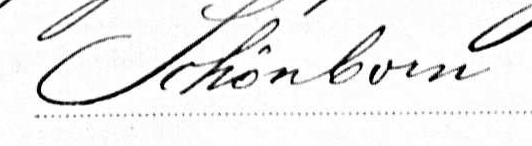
Schönborn
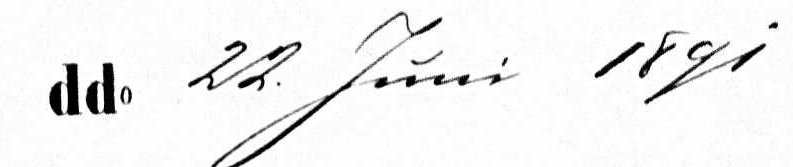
ddo 22. Juni 1891
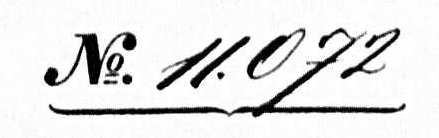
No. 11072
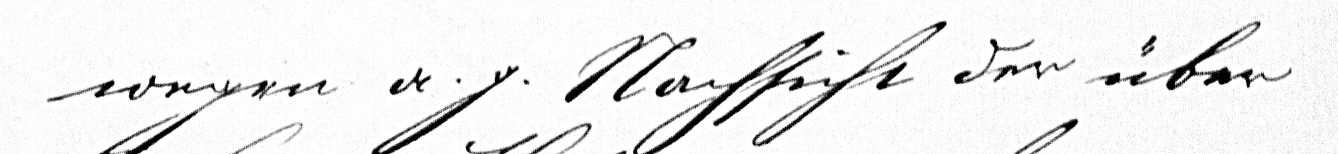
Wegen a.g. Nachsicht der über
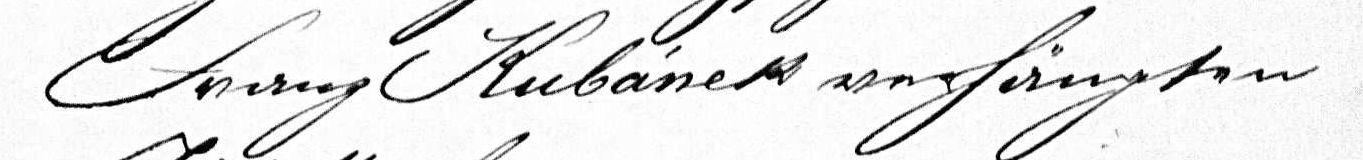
Franz Kubánek verhängten
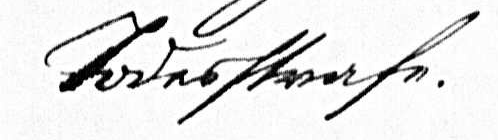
Todesstrafe.
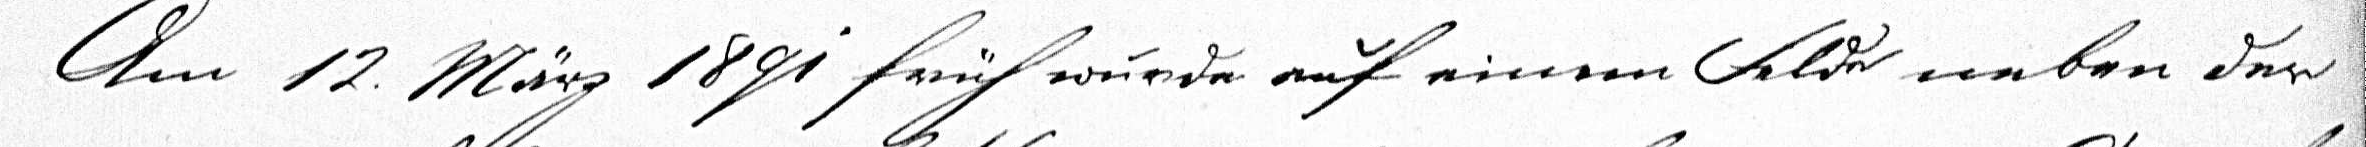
Am 12. März 1891 früh wurde auf einem Felde neben der
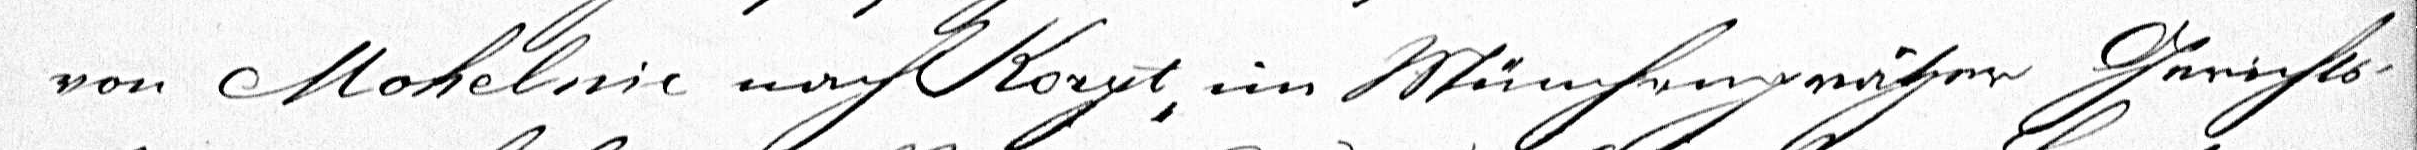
von Mohelnic nach Koryt, im Münchengrätzer Gerichts¬
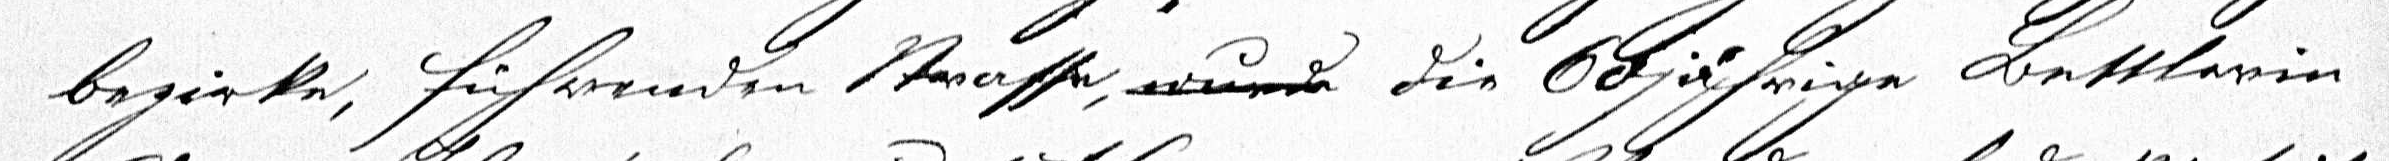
bezirk, führenden Strasse, die 60jährige Bettlerin
